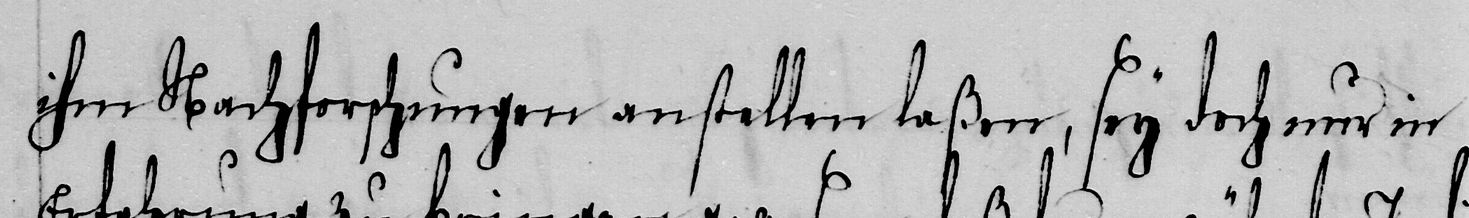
ihm Nachforschungen anstellen laßen, sey doch nur in
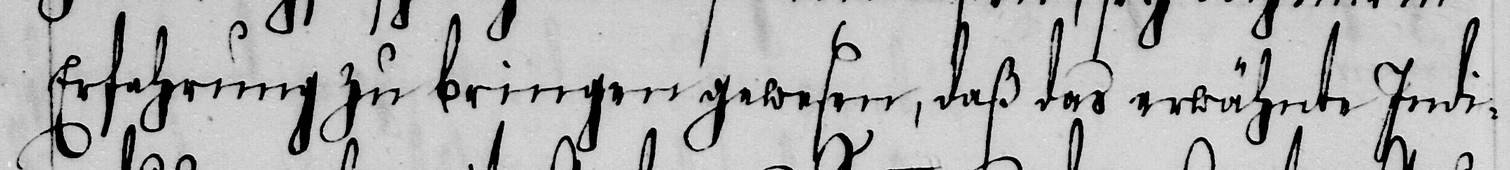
Erfahrung zu bringen gewesen, daß das erwähnte Indi¬
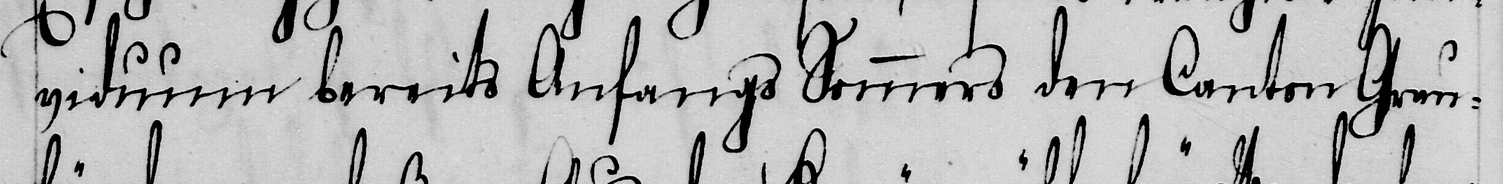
viduum bereits Anfangs Sommers den Canton Grau¬
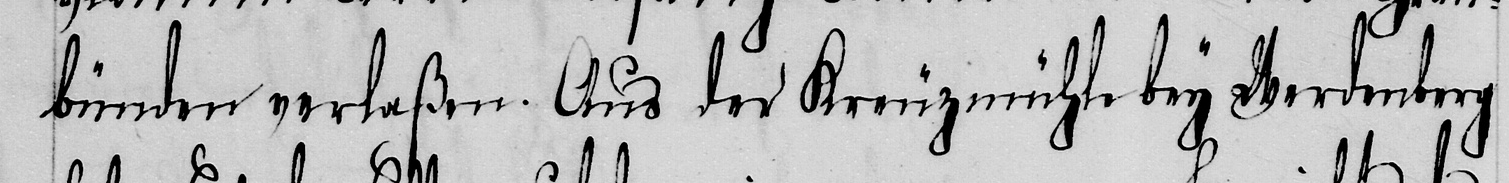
bünden verlaßen. Aus der Kreuzmühle bey Werdenberg
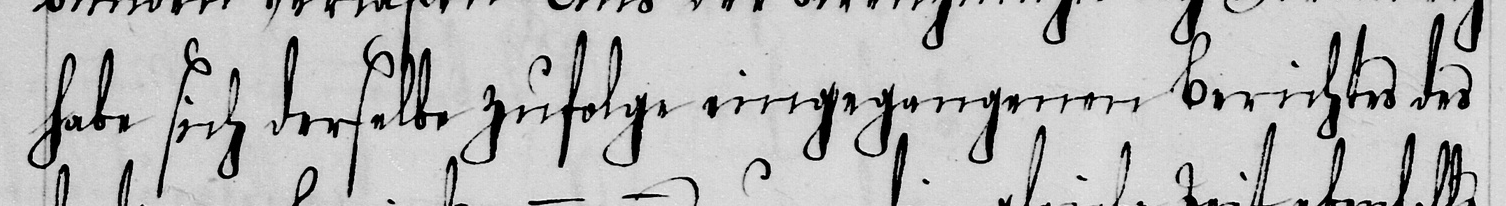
habe sich derselbe zufolge eingegangenen Berichtes des
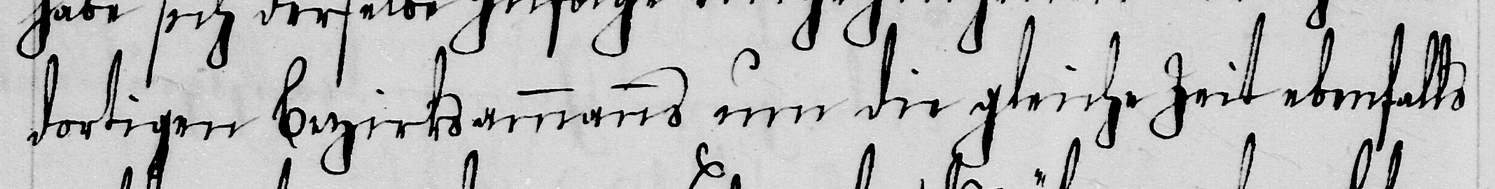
dortigen Bezirksammanns um die gleiche Zeit ebenfalls
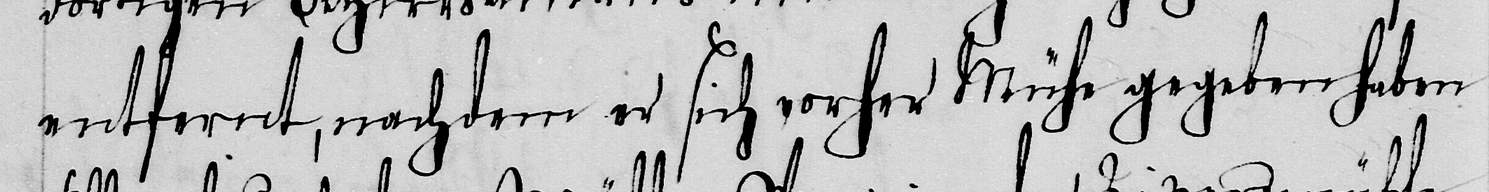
entfernt, nachdem er sich vorher Mühe gegeben haben
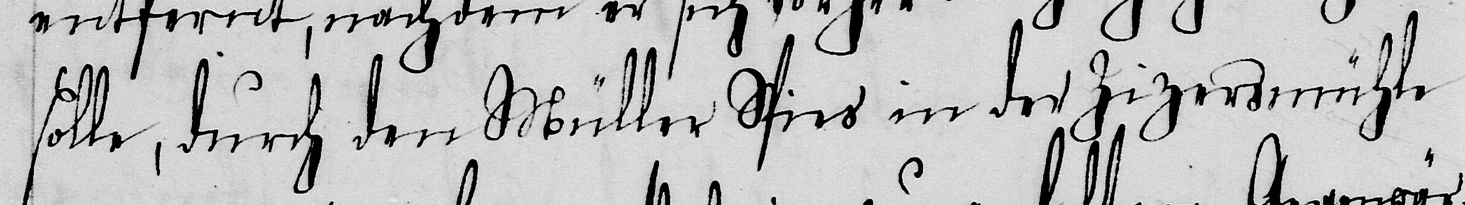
solle, durch den Müller Spies in der Zizersmühle
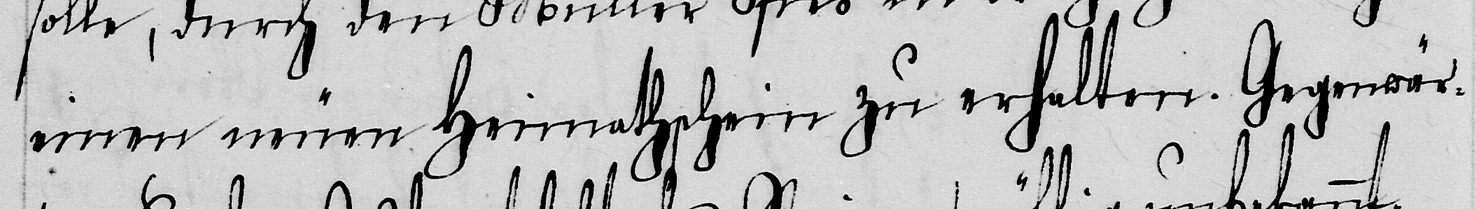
einen neuen Heimathschein zu erhalten. Gegenwär¬
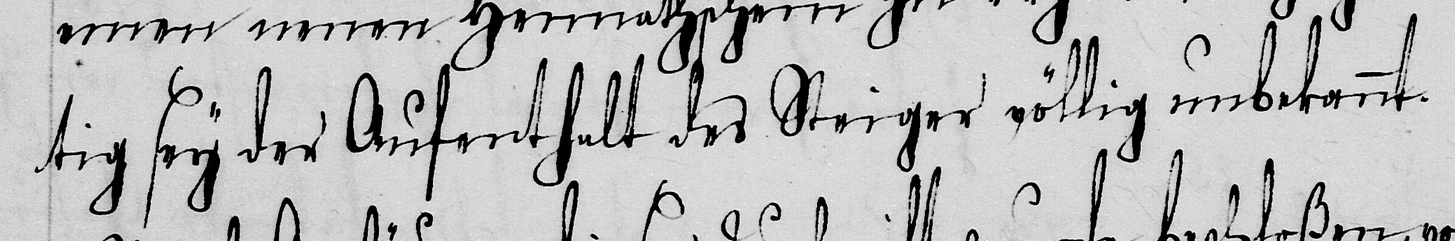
tig sey der Aufenthalt des Steiger völlig unbekannt.
